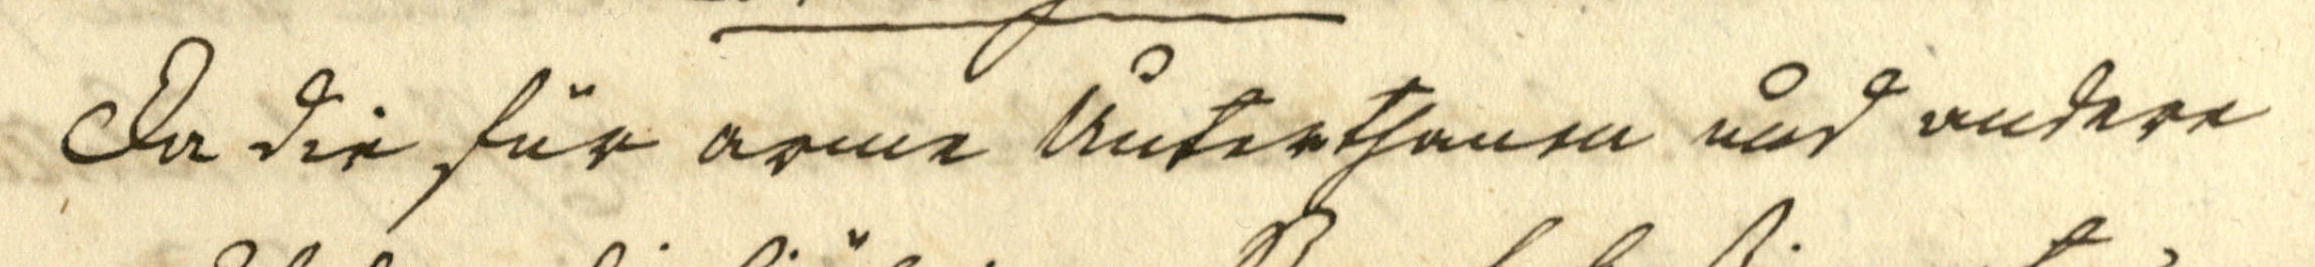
Da die für arme Unterthanen und andere
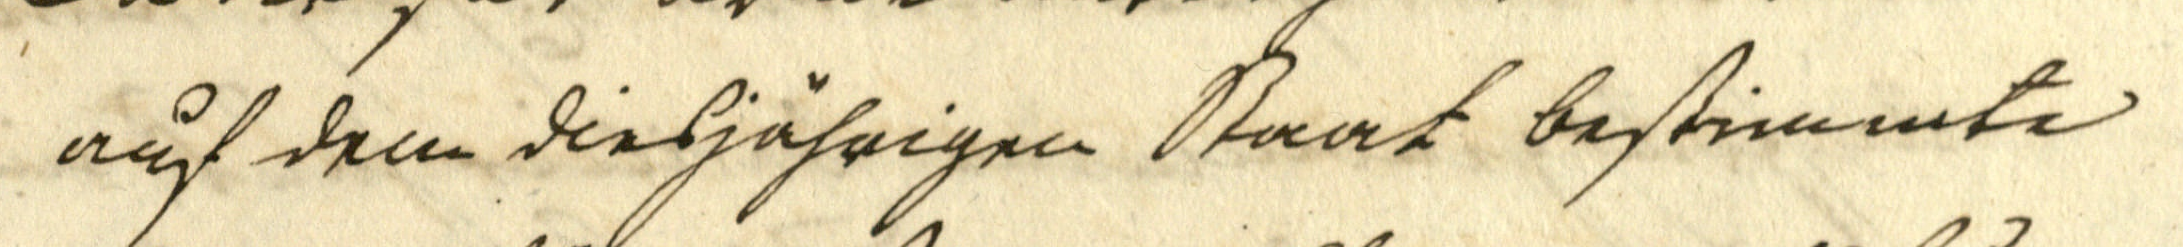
auf dem diesjährigen Staat bestimmte
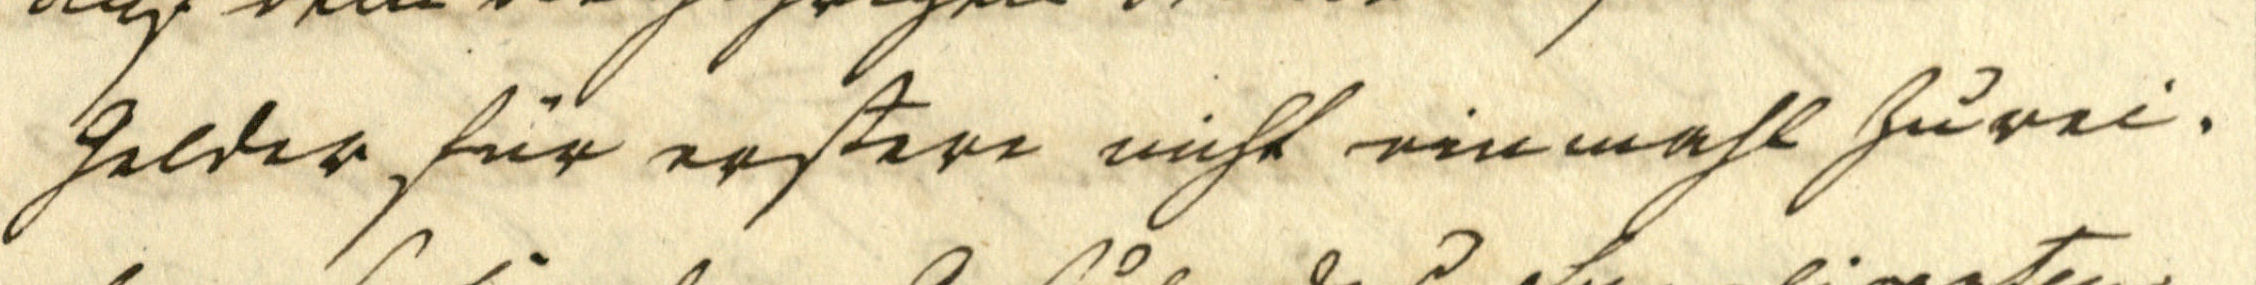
Gelder für erstere nicht einmahl zurei¬
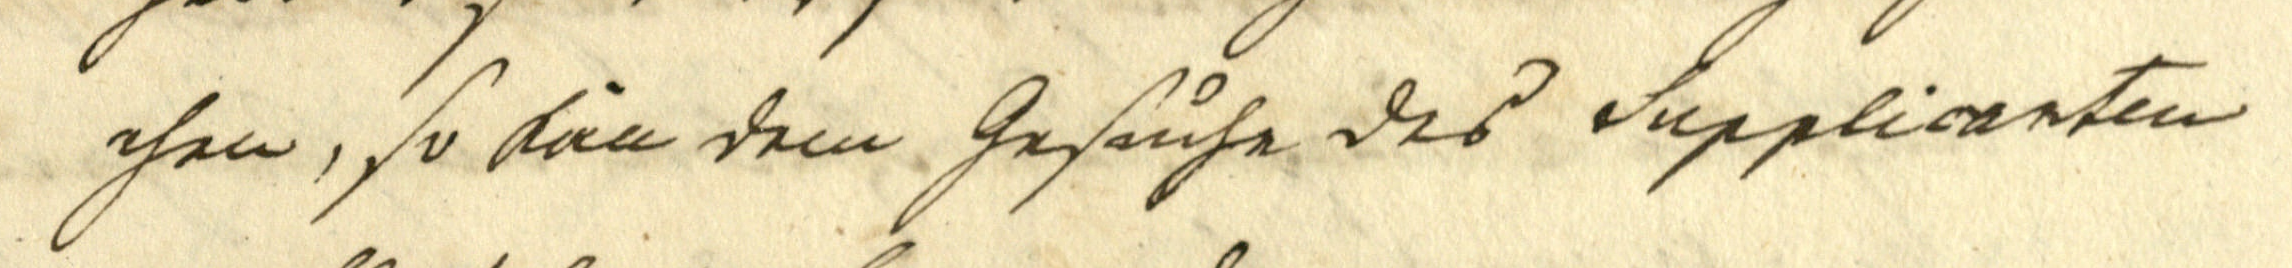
chen, so kan dem Gesuche des Supplicanten
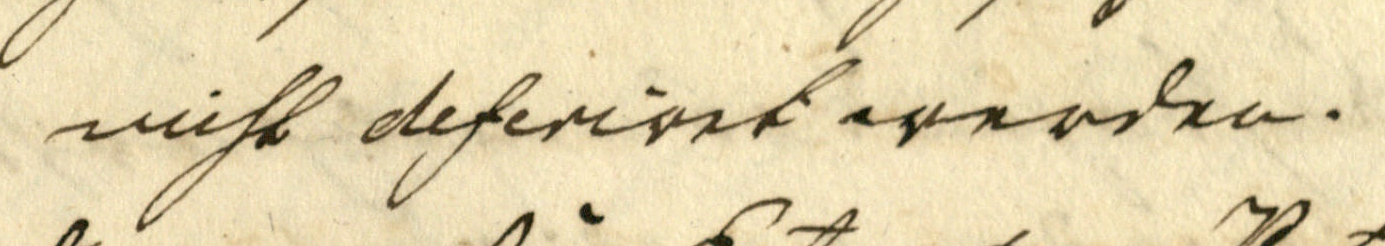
nicht deferiret werden.
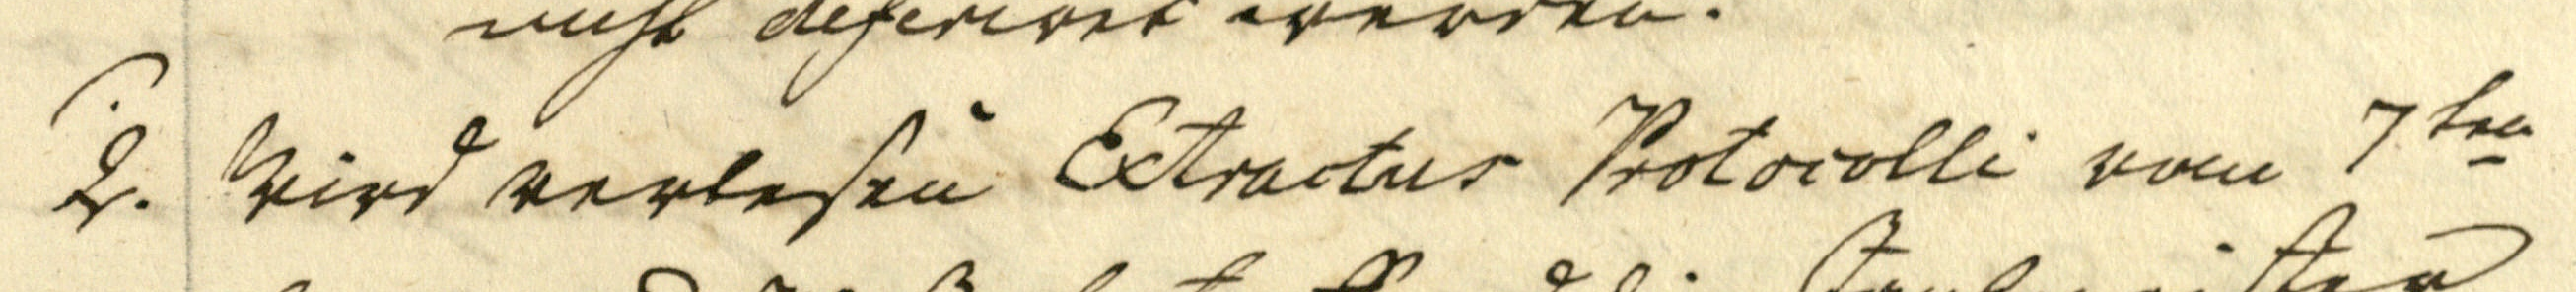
2. Wird verlesen Extractus Protocolli vom 7 ten
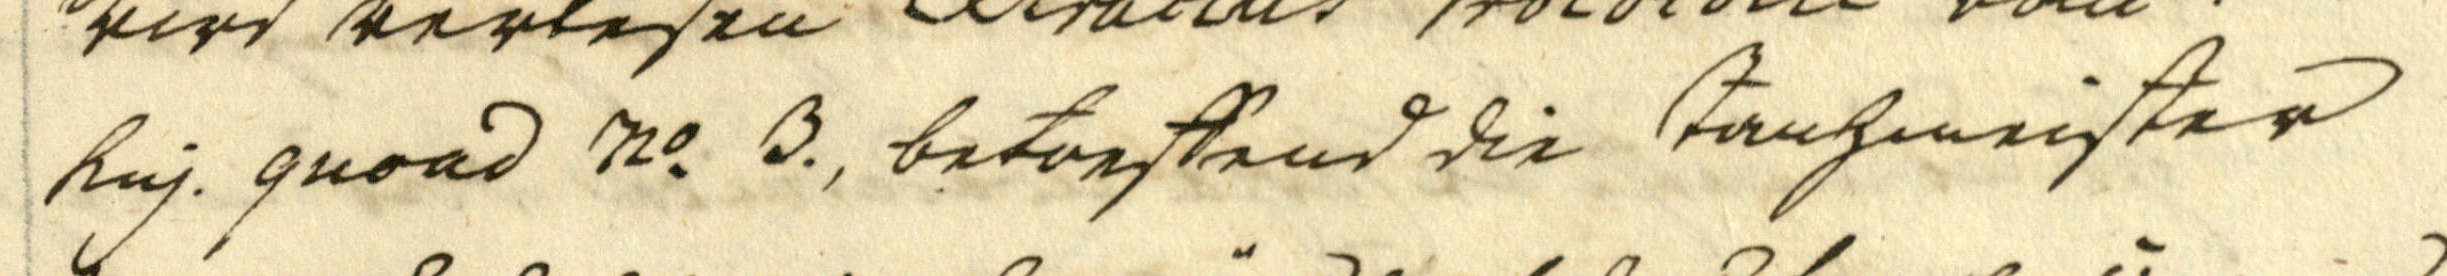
huj. quoad No. 3. betreffend die Tanzmeister
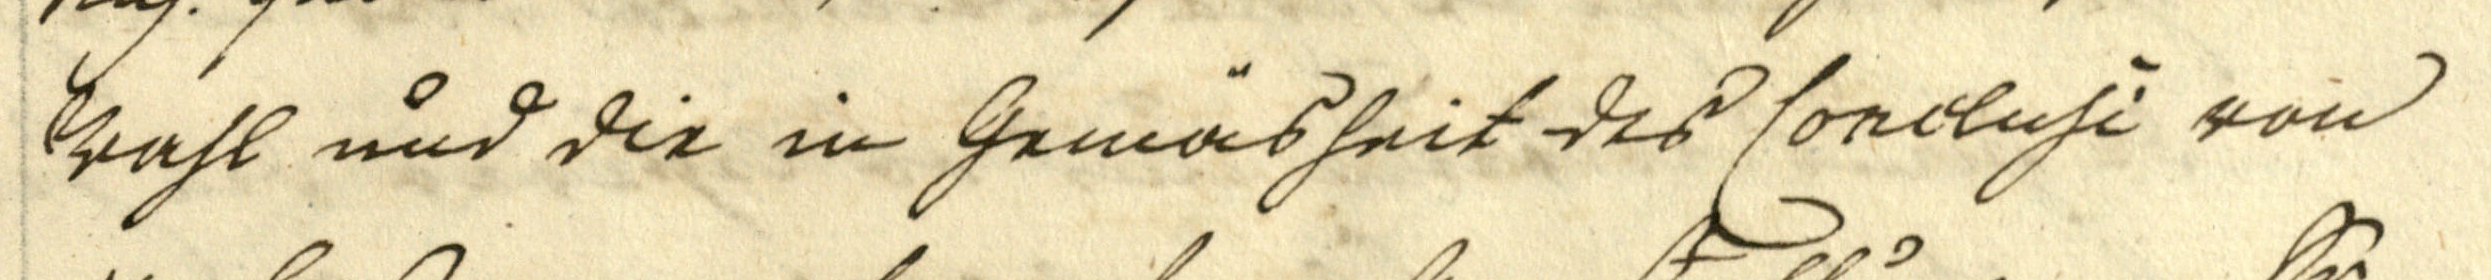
Wahl und die in Gemäsheit des Conclusi von
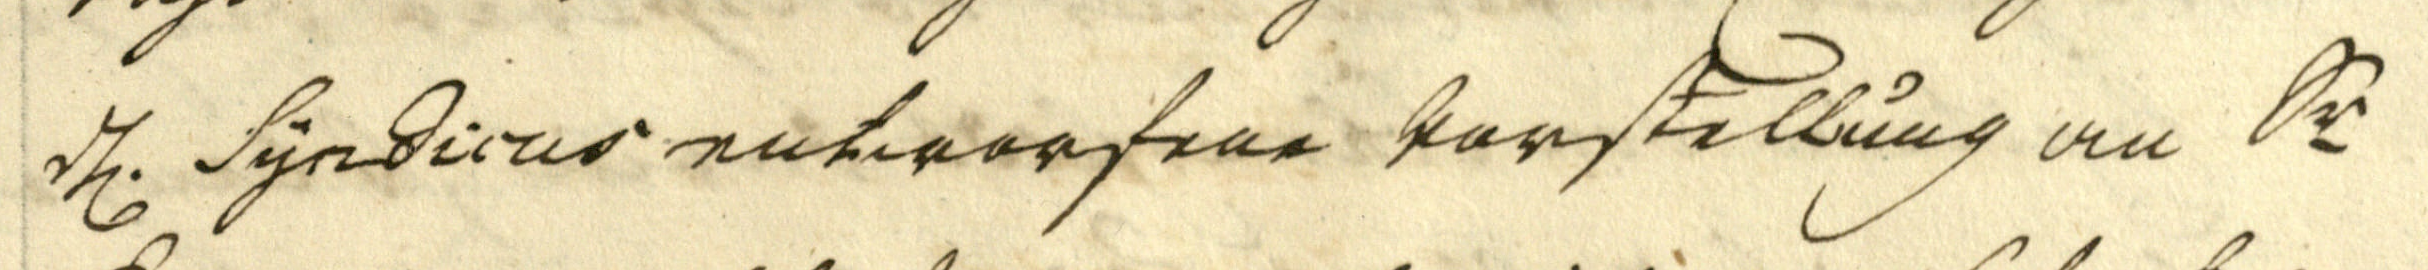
dh. Sÿndicus entworfene Vorstellung an Sr
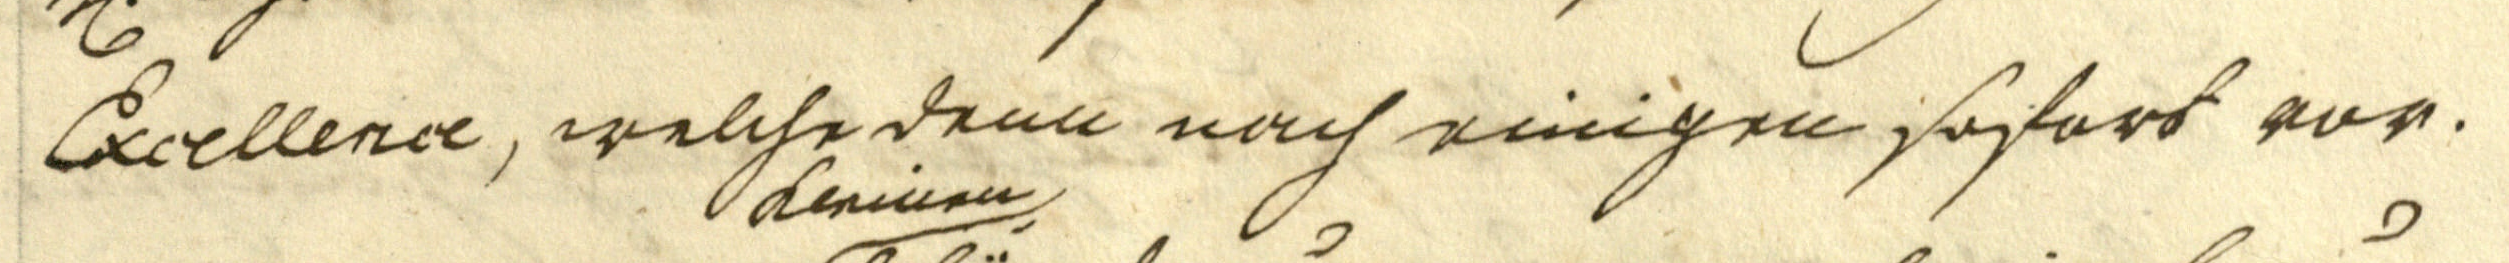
Excellence, welche denn nach einigen sofort vor¬
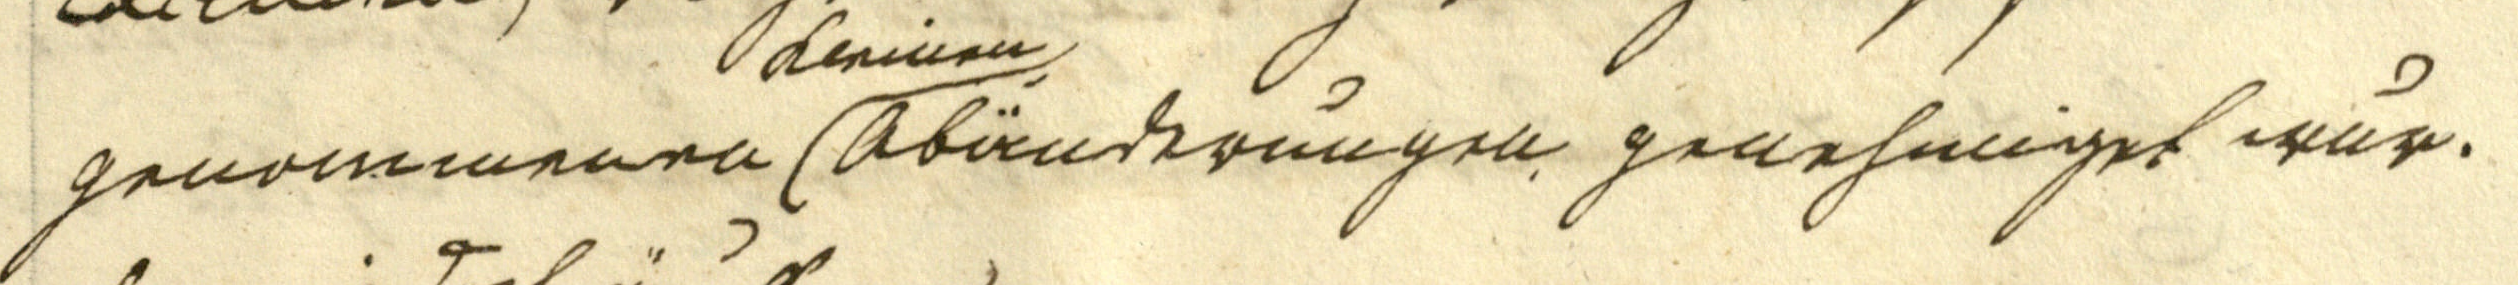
genommenen kleinen Abänderungen, genehmiget wur¬
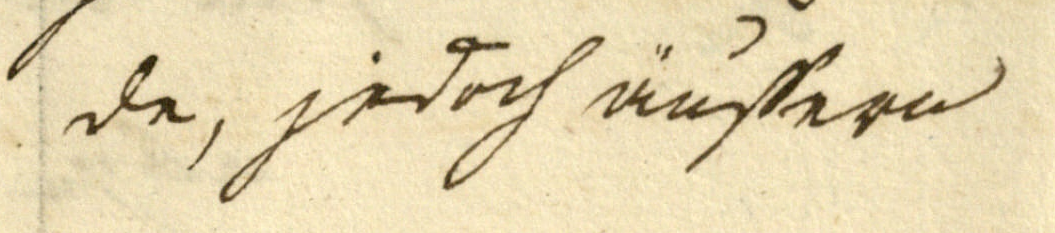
de, jedoch äussern
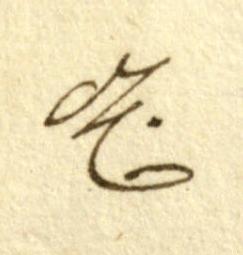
dh.
